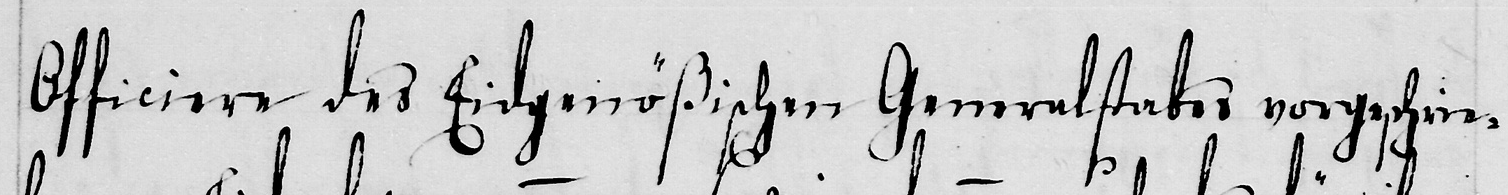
Officiere des Eidgenößischen Generalstabes vorgeschrie¬
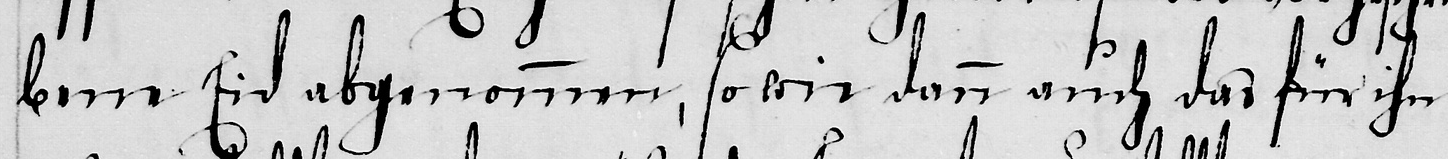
bene Eid abgenommen, sowie dann auch das für ihn
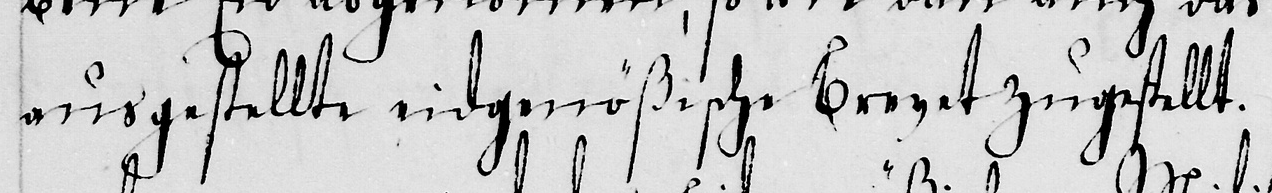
ausgestellte eidgenößische Brevet zugestell¬
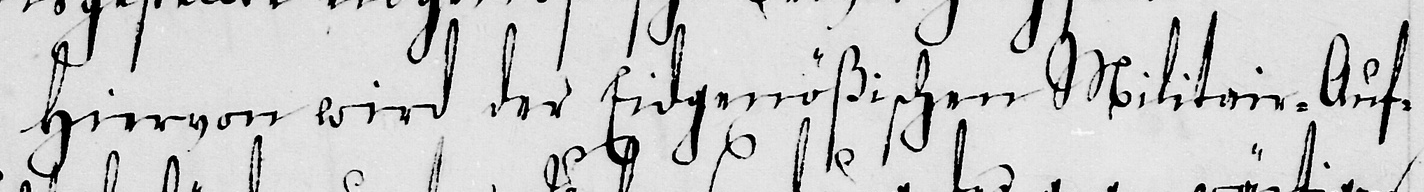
Hiervon wird der Eidgenößischen Militair-Auf¬
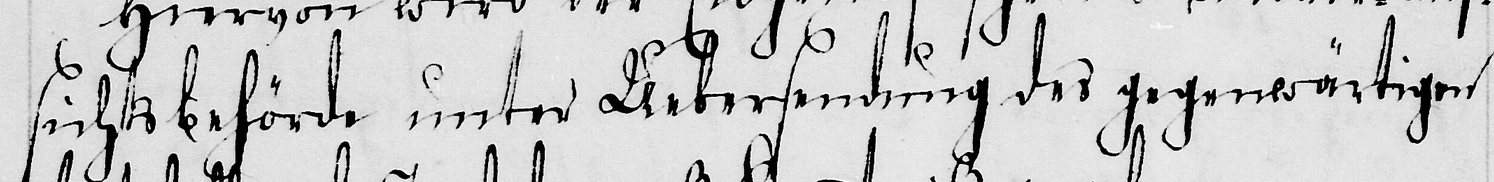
sichtsbehörde unter Uebersendung des gegenwärtigen
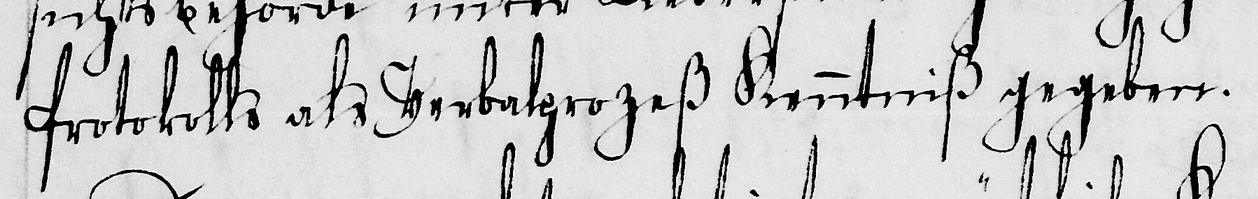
Protokolls als Verbalprozeß Kenntniß gegeben.
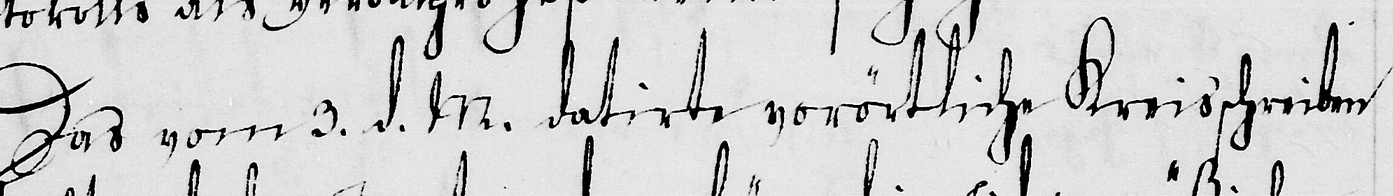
Das vom 3. d. M. datirte vorörtliche Kreisschreiben
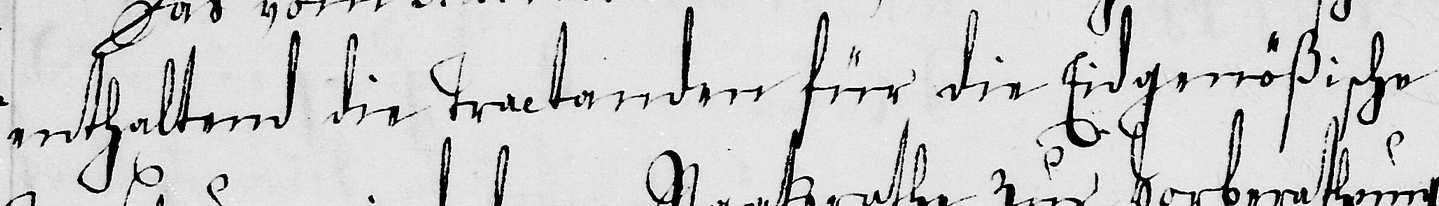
enthaltend die Tractanden für die Eidgenößische
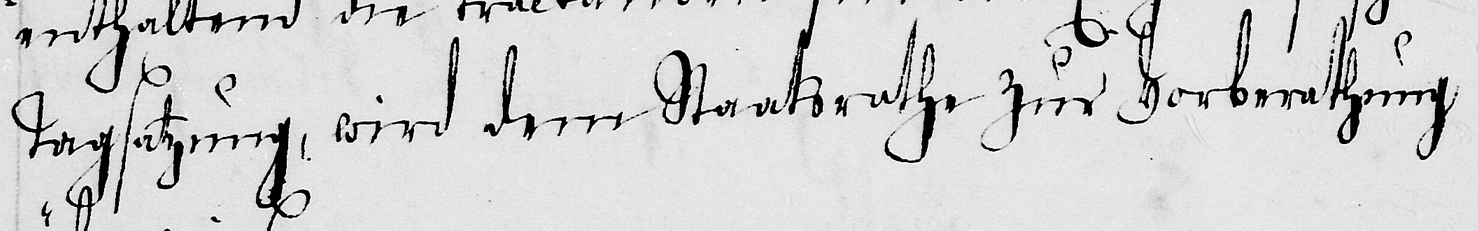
Tagsatzung, wird dem Staatsrathe zur Vorberathung
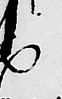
t.
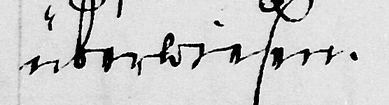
überwiesen.
